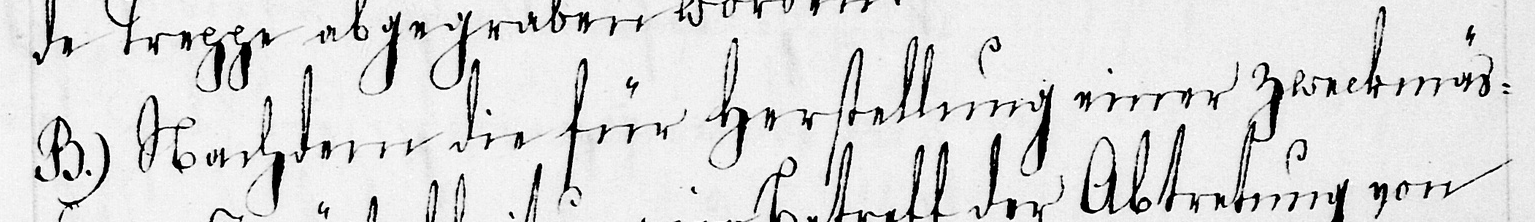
B.) Nachdem die für Herstellung einer zweckmä¬
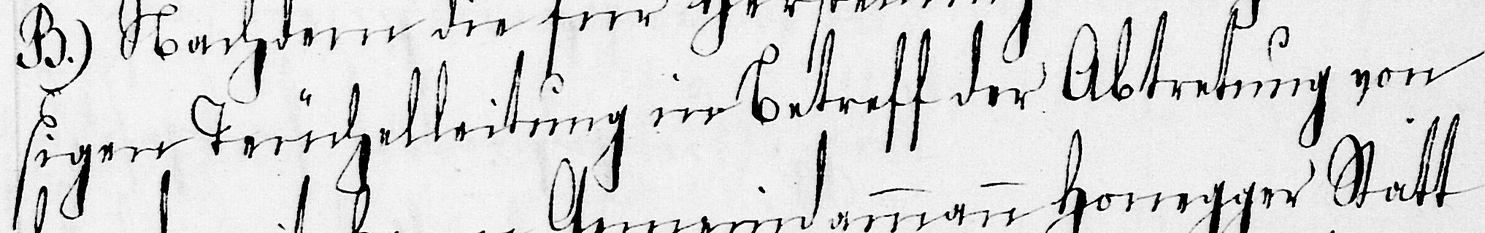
ßigen Teuchelleitung in Betreff der Abtretung von
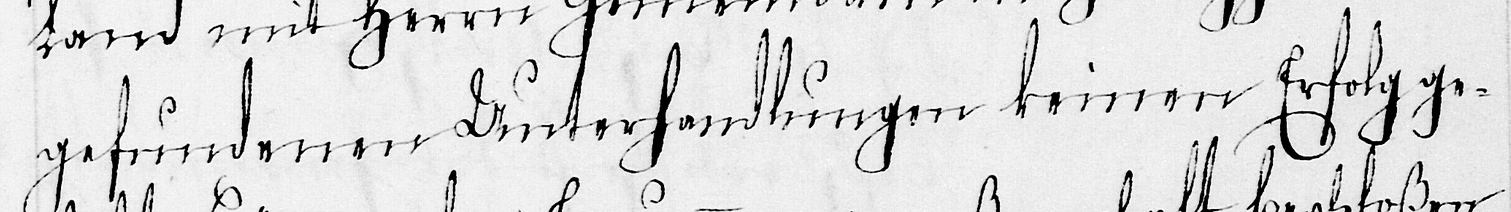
gefundenen Unterhandlungen keinen Erfolg ge¬
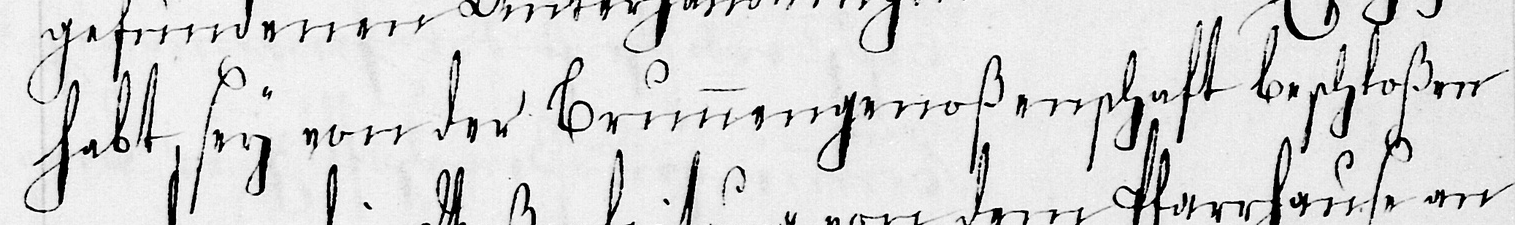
habt, sey von der Brunnengenoßenschaft beschloßen
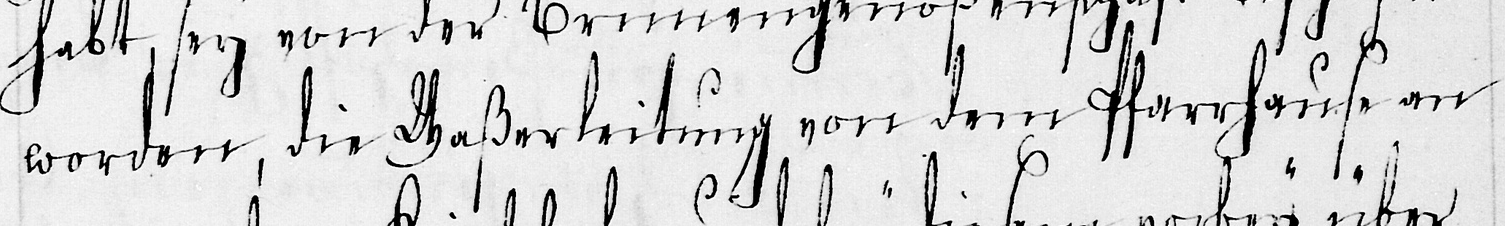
worden, die Waßerleitung von dem Pfarrhause an
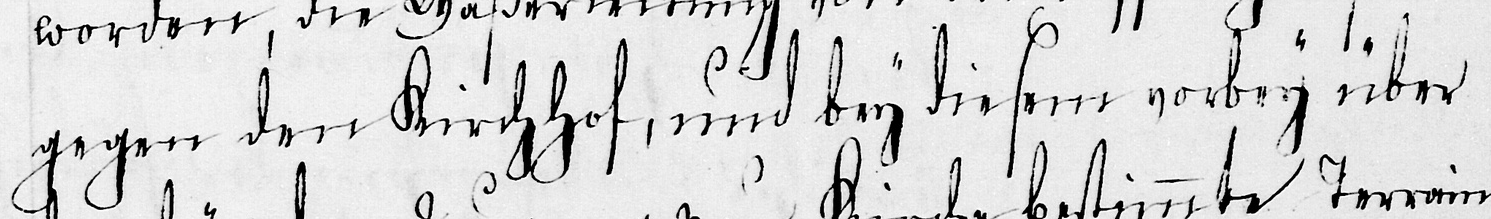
gegen den Kirchhof, und bey diesem vorbey über
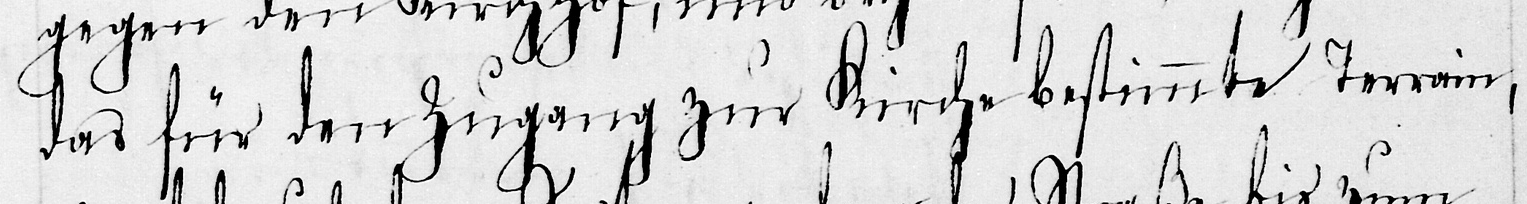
das für den Zugang zur Kirche bestimmte Terrain,
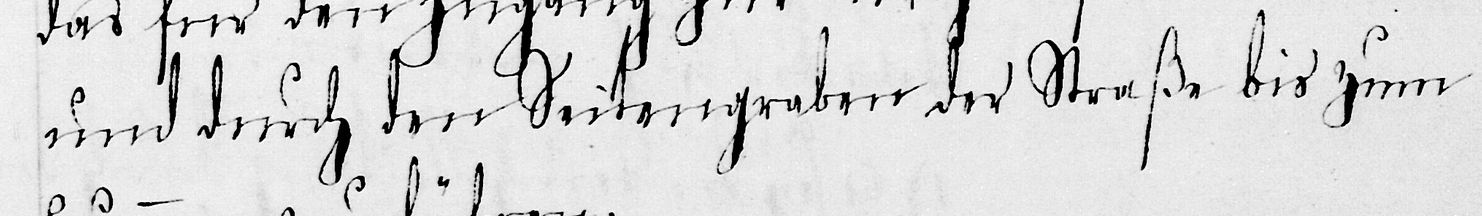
und durch den Seitengraben der Straße bis zum
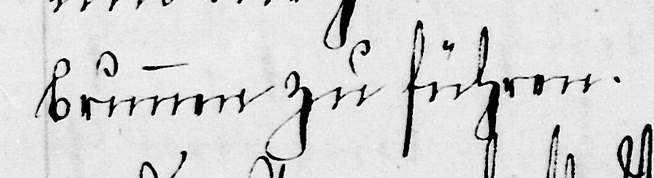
Brunnen zu führen.
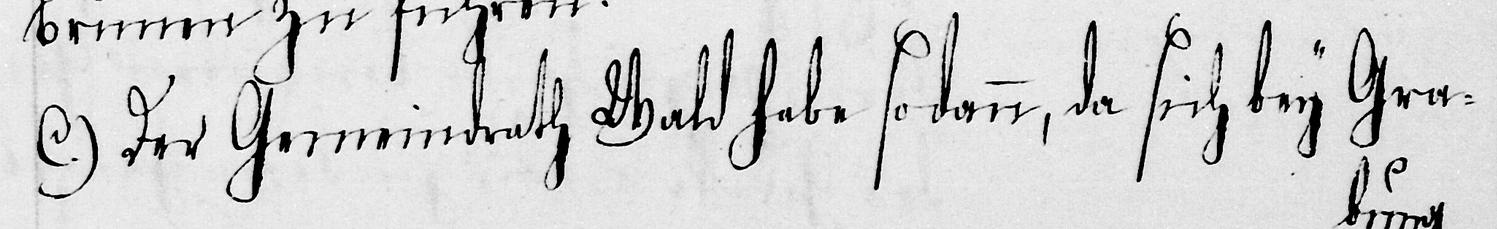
C.) Der Gemeindrath Wald habe sodann, da sich bey Gra-
